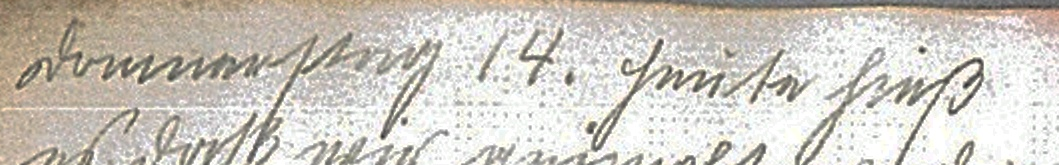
Donnerstag 14. Heute hieß
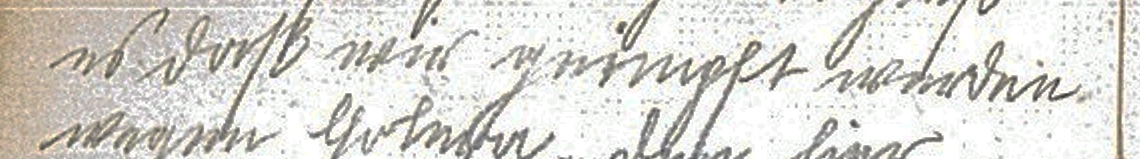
es daß wir geimpft werden
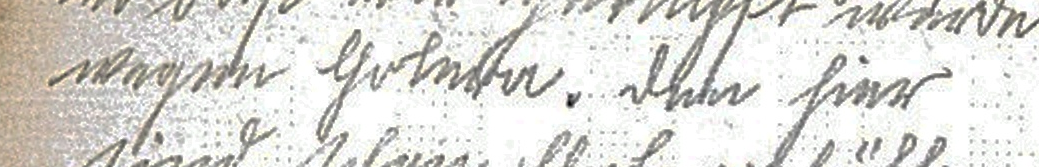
wegen Cholera. Denn hier
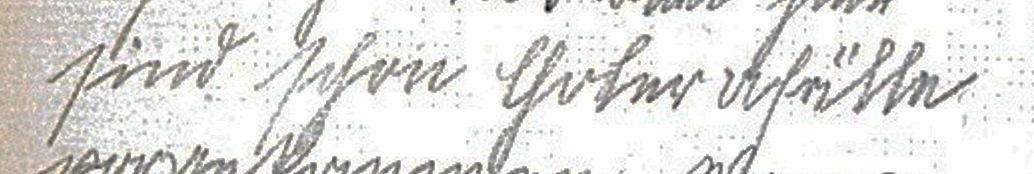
sind schon Cholerafälle
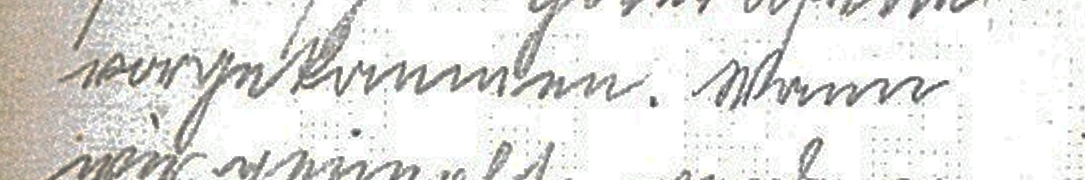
vorgekommen. Wann
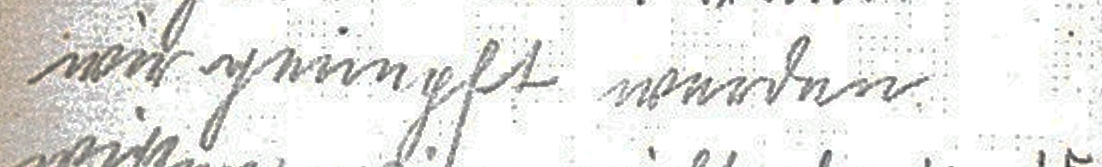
wir geimpft werden
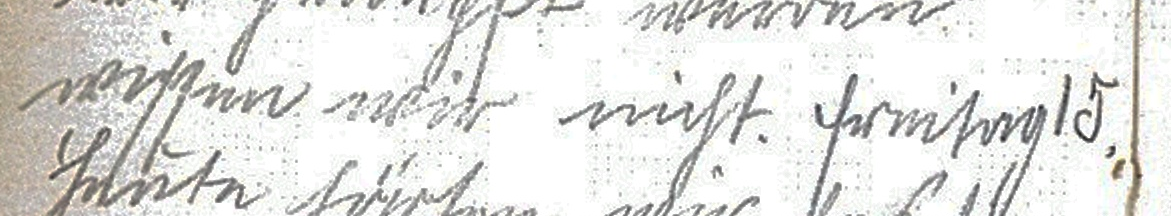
wissen wir nicht. Freitag 15.
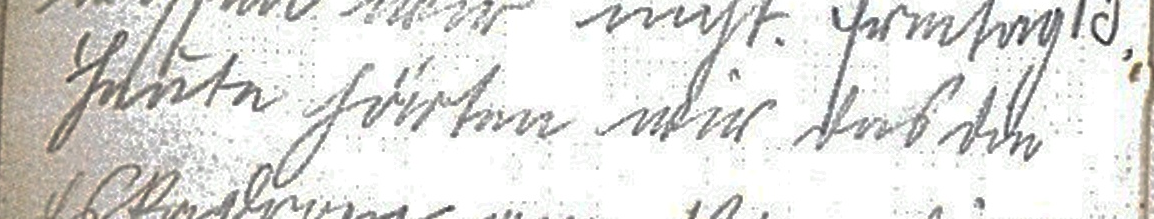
heute hörten wir das die
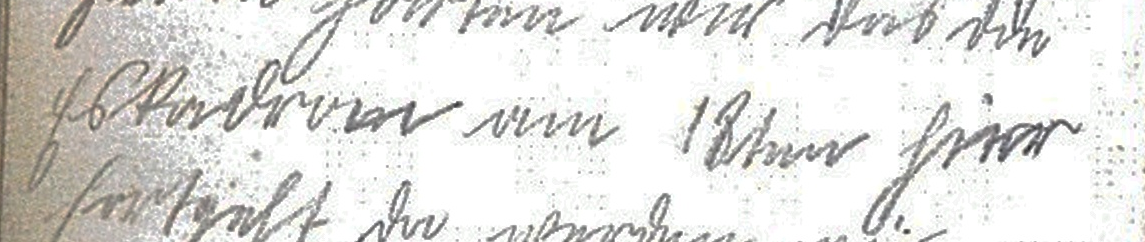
Eskadron am 18ten hier
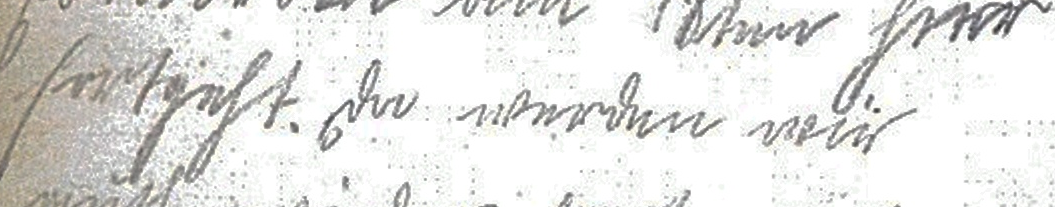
fortgeht. Da werden wir
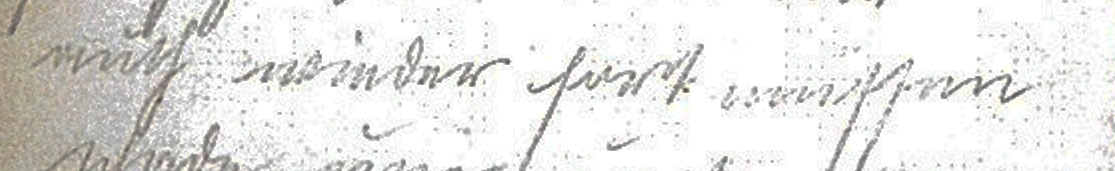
auch wieder fort müssen
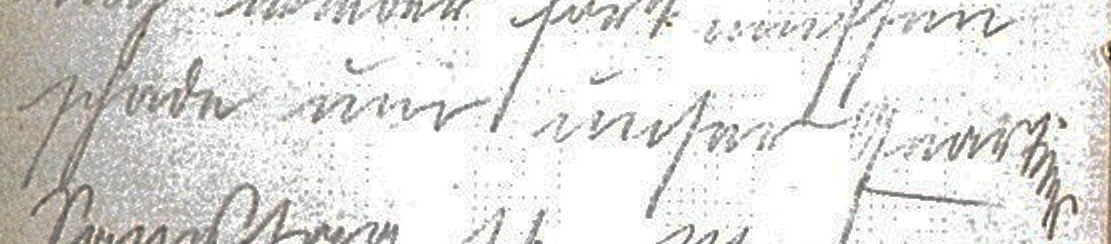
schade um unser Quartier
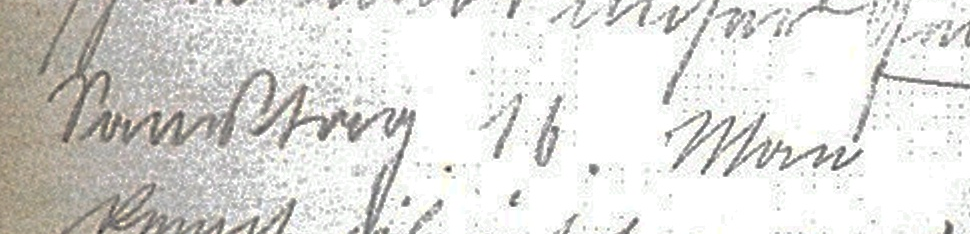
Sonntag 16. Man
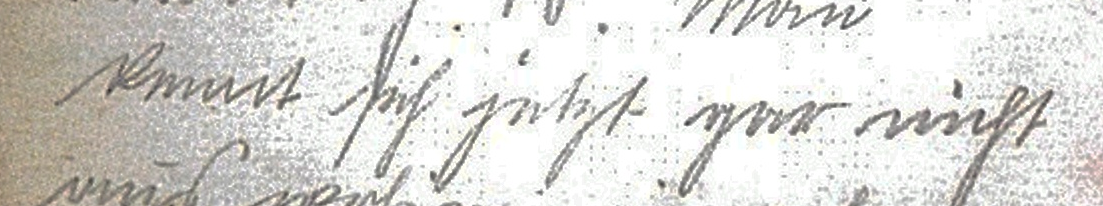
kennt bis jetzt gar nicht
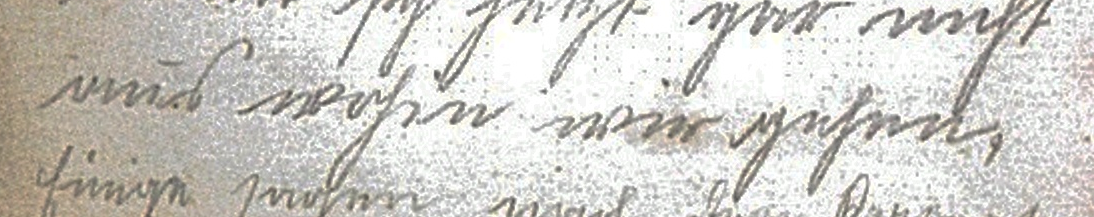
und wohin wir gehen
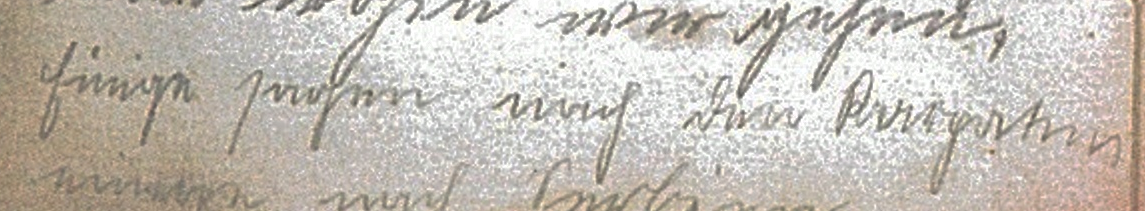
einige sagen nach den Karpaten
